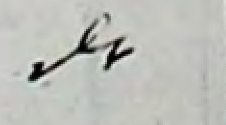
do
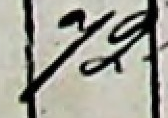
72
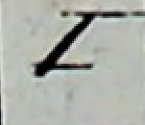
I
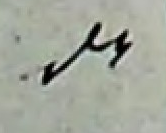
do
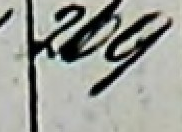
269
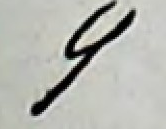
9
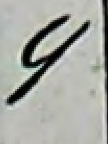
9
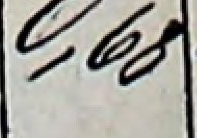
0,68
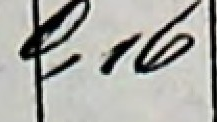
0,16
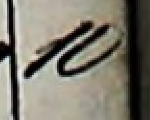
10
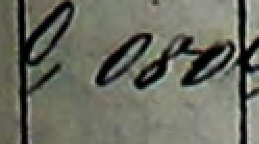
0,080
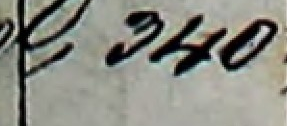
0,340
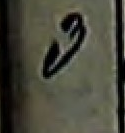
3
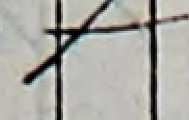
7
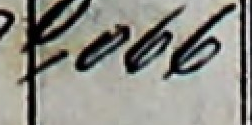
0,066
